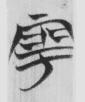𩁹
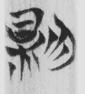則
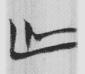亡
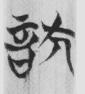{言犬}
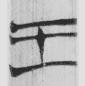王
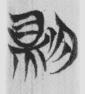則
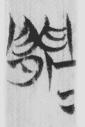門外=
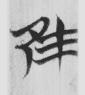隹
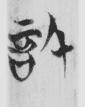信
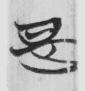是
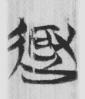{辶取}
